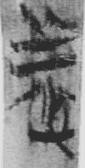𢝬（圖）
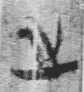之
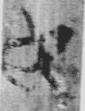女（如）
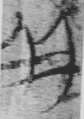并
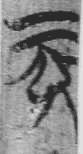天
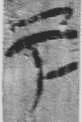下
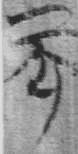而
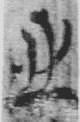之
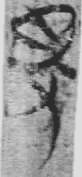○（得）
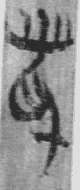○（一）
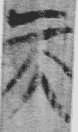而
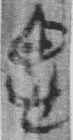思
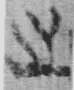之
